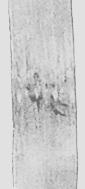七十=
